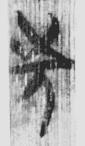先
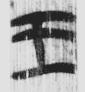王
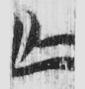亡
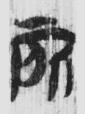所
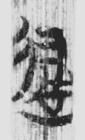○（歸）
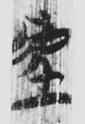○（吾）
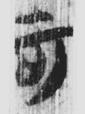可（何）
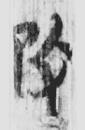改
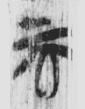而
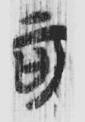可
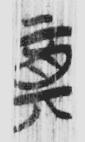奠（鄭）
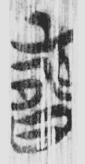壽
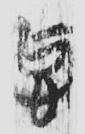○（辭）
